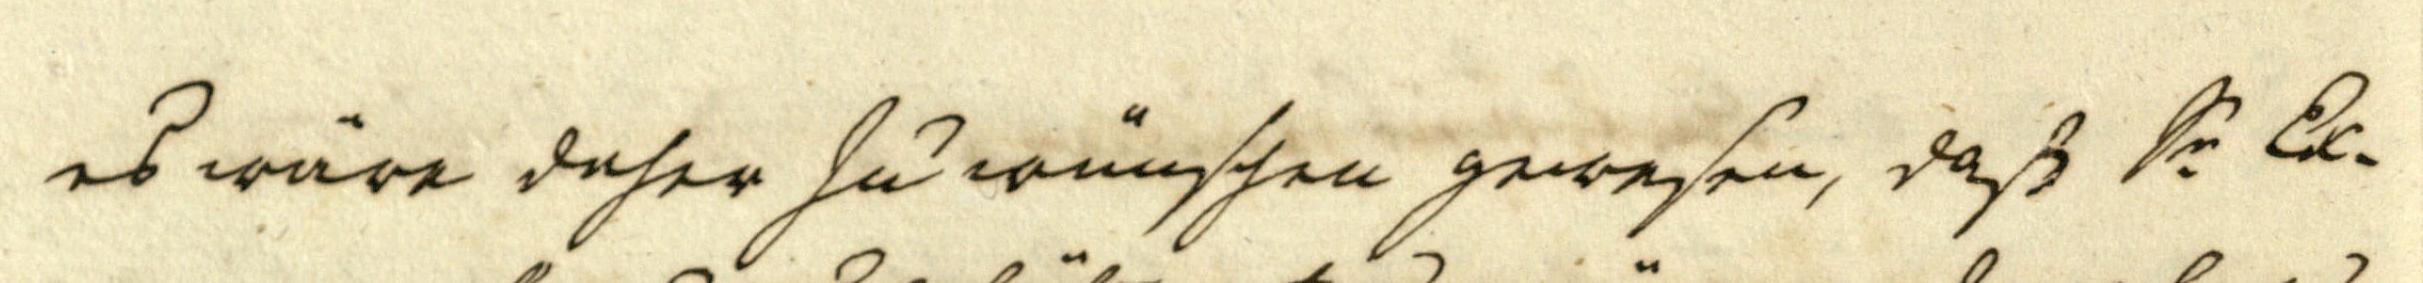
es wäre daher zu wünschen gewesen, daß Sr Ex¬
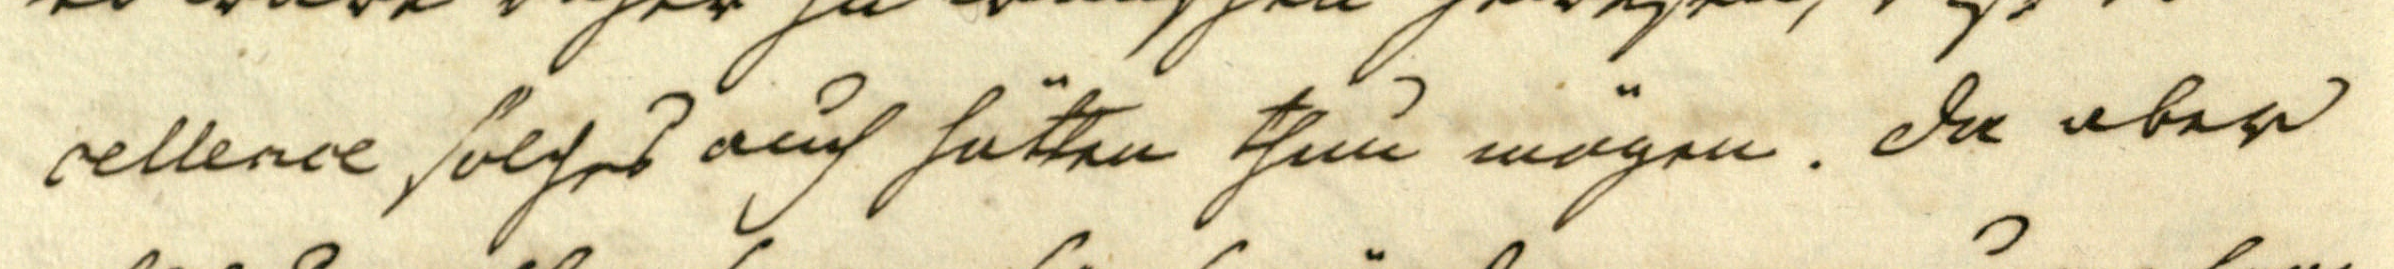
cellence solches auch hätten thun mögen. Da aber
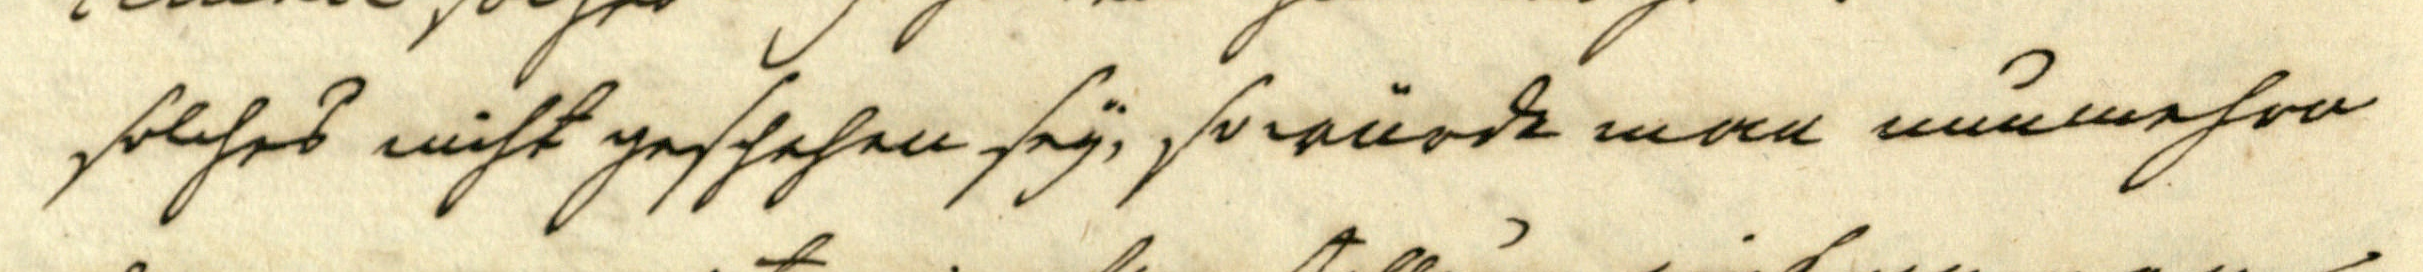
solches nicht geschehen seÿ, so würde man nunmehro
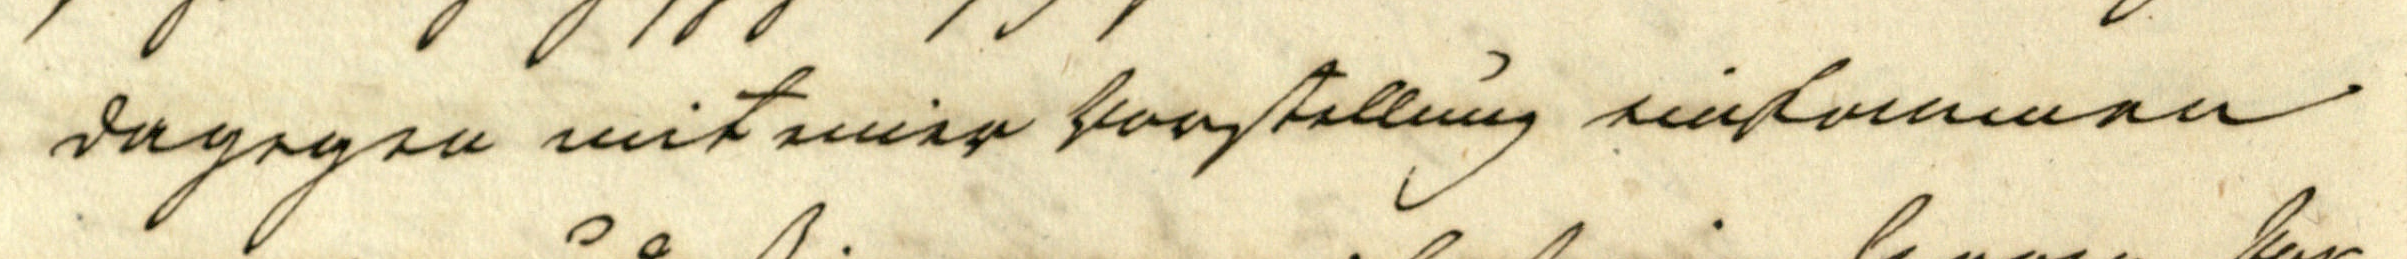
dagegen mit einer Vorstellung einkommen
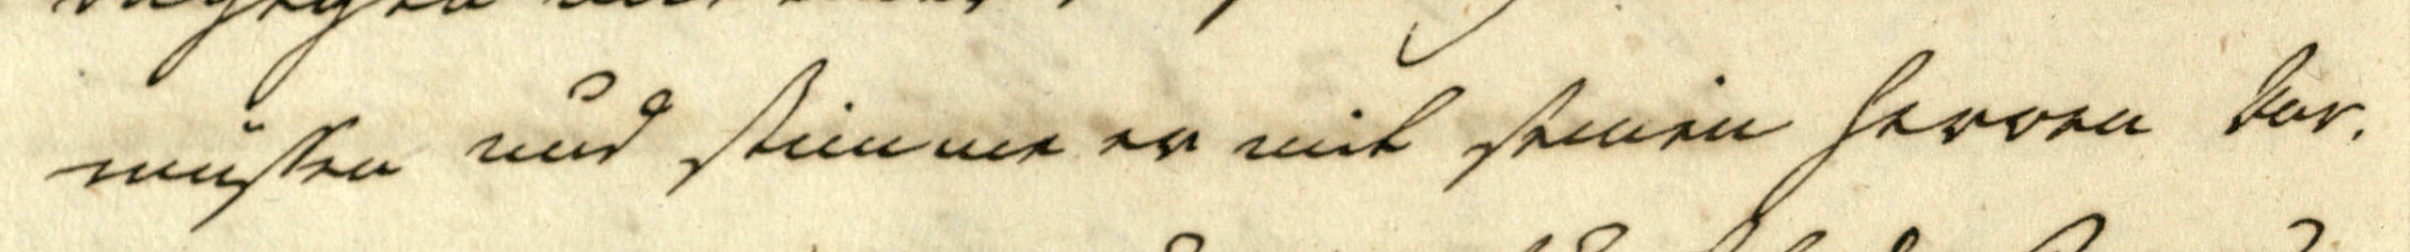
müssen und stimme er mit seinen Herren Vor¬
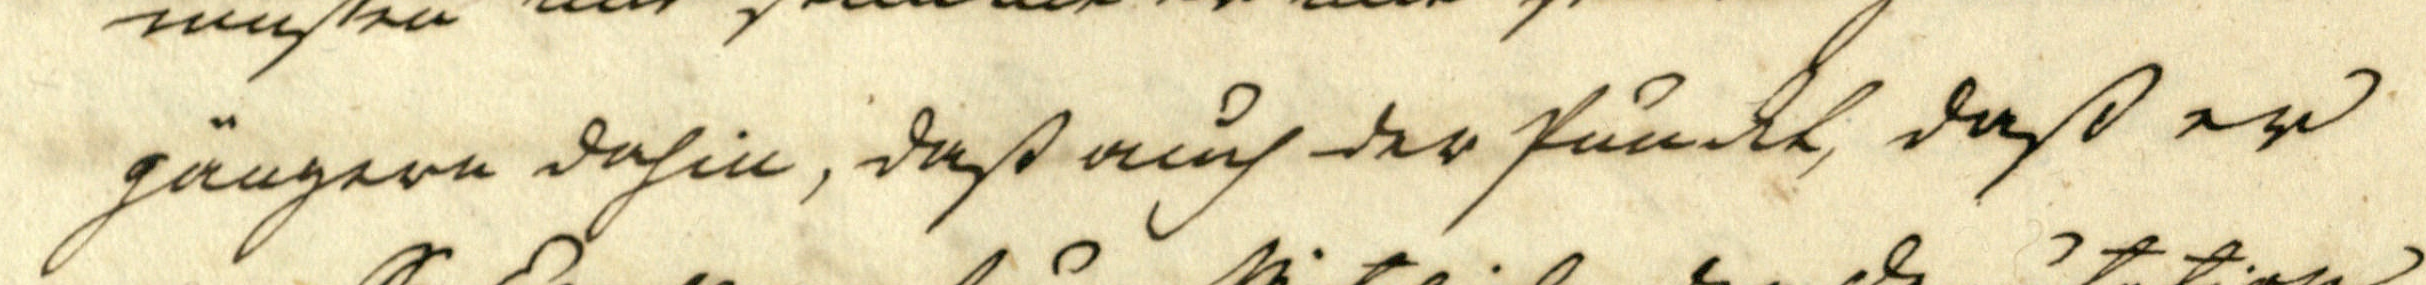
gängern dahin, daß auch der Punckt, daß er
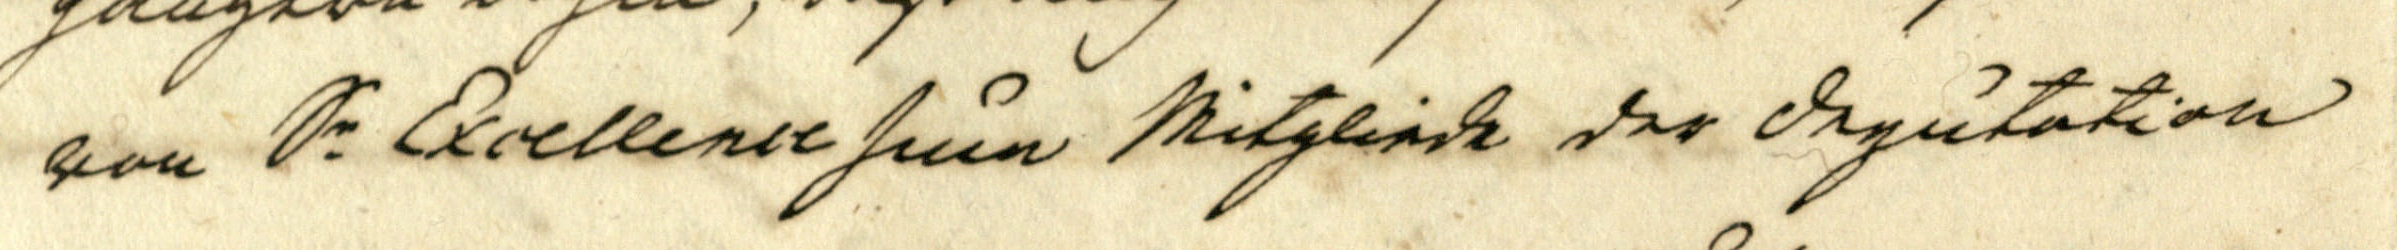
von Sr Excellence zum Mitgliede der Deputation
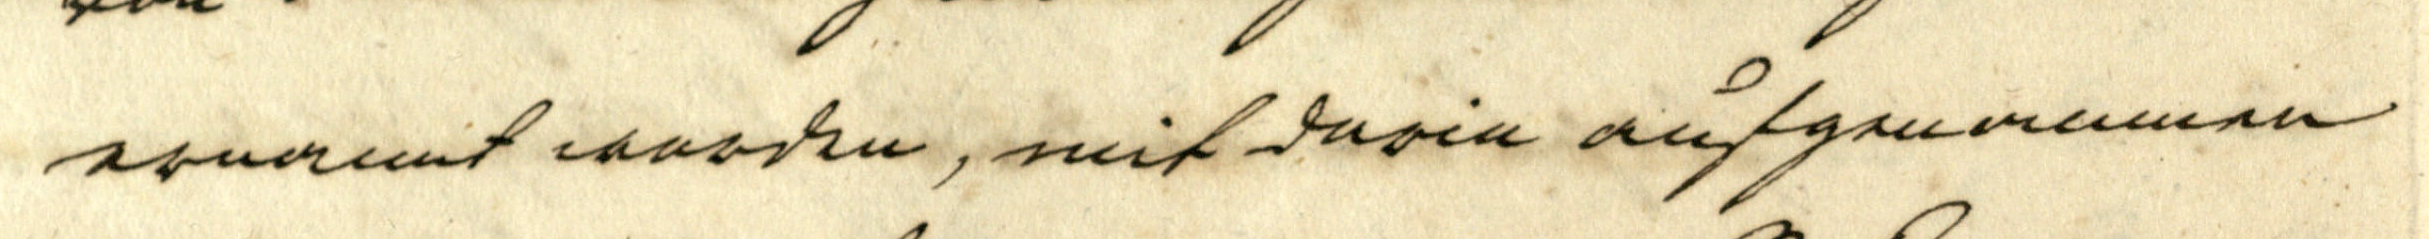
ernannt worden, mit darin aufgenommen
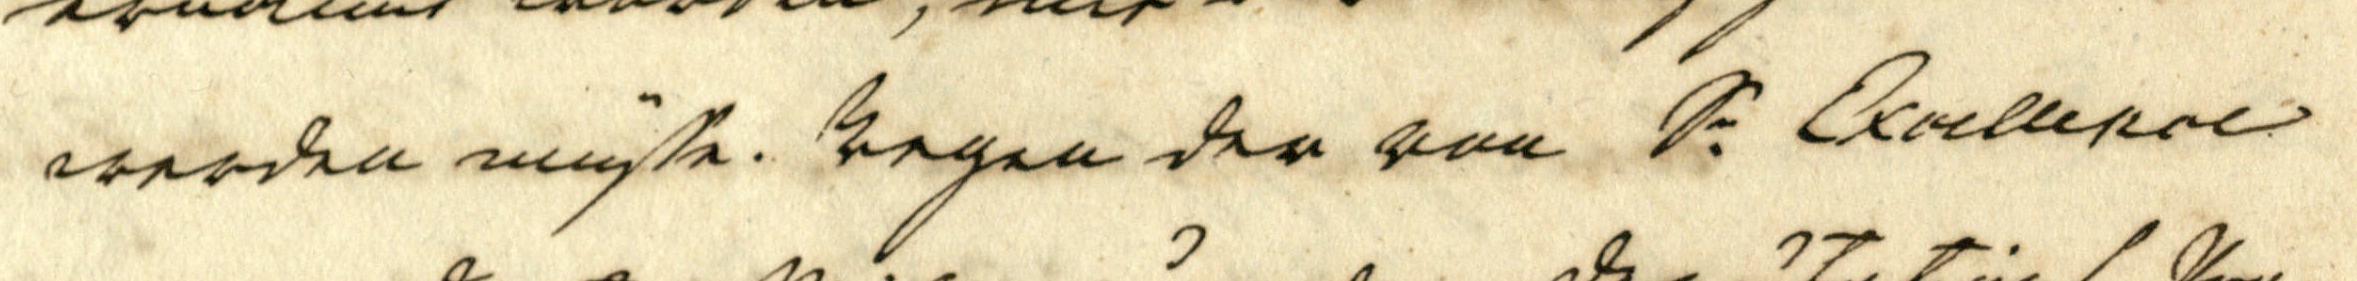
werden müsse. Wegen der von Sr. Excellence
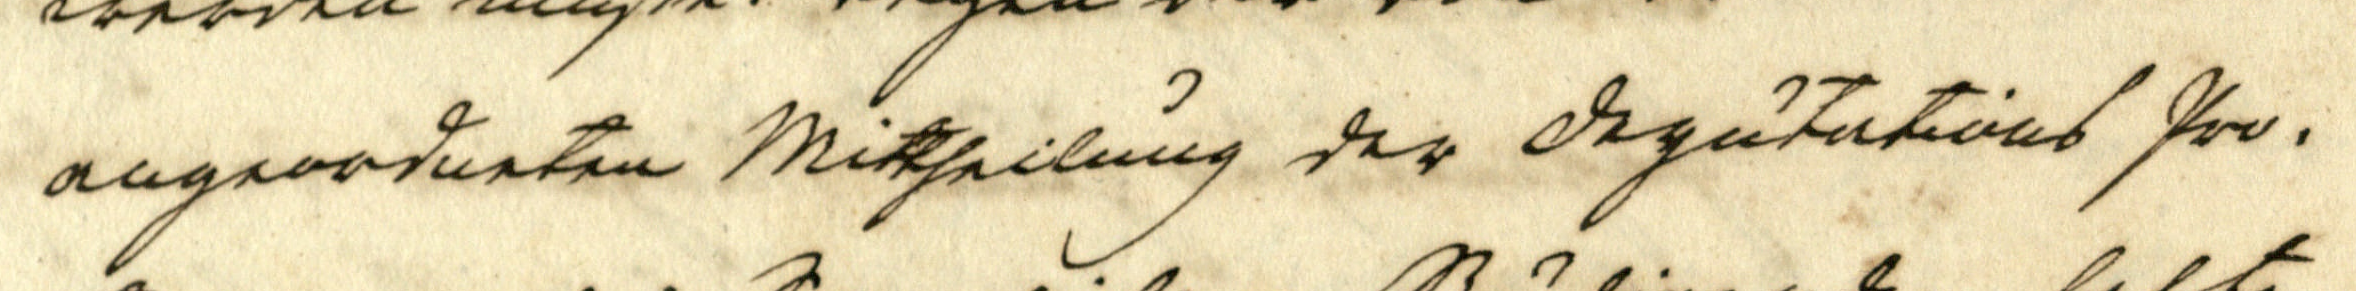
angeordneten Mittheilung der degutatinns Pro¬
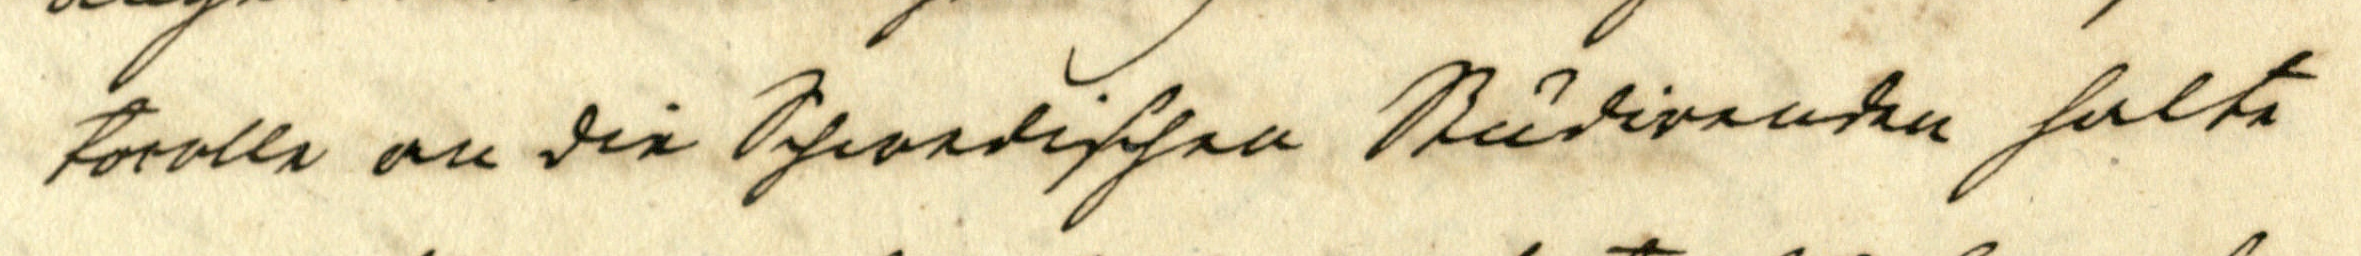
tocolle an die Schwedischen Studirenden halte
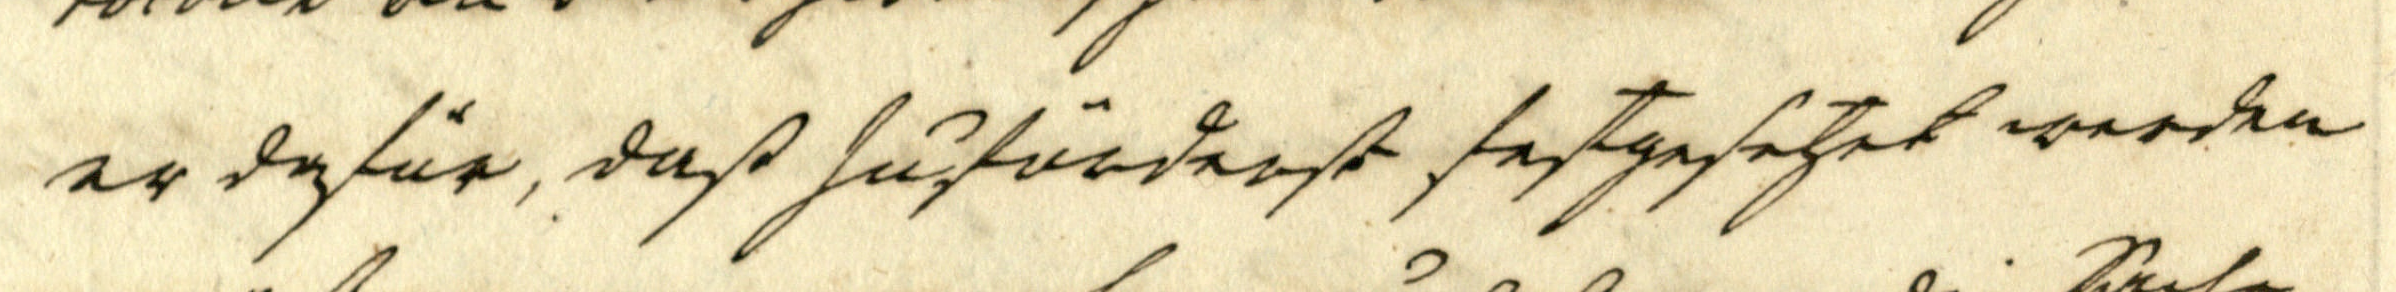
er dafür, daß zuförderst festgesetzet werden
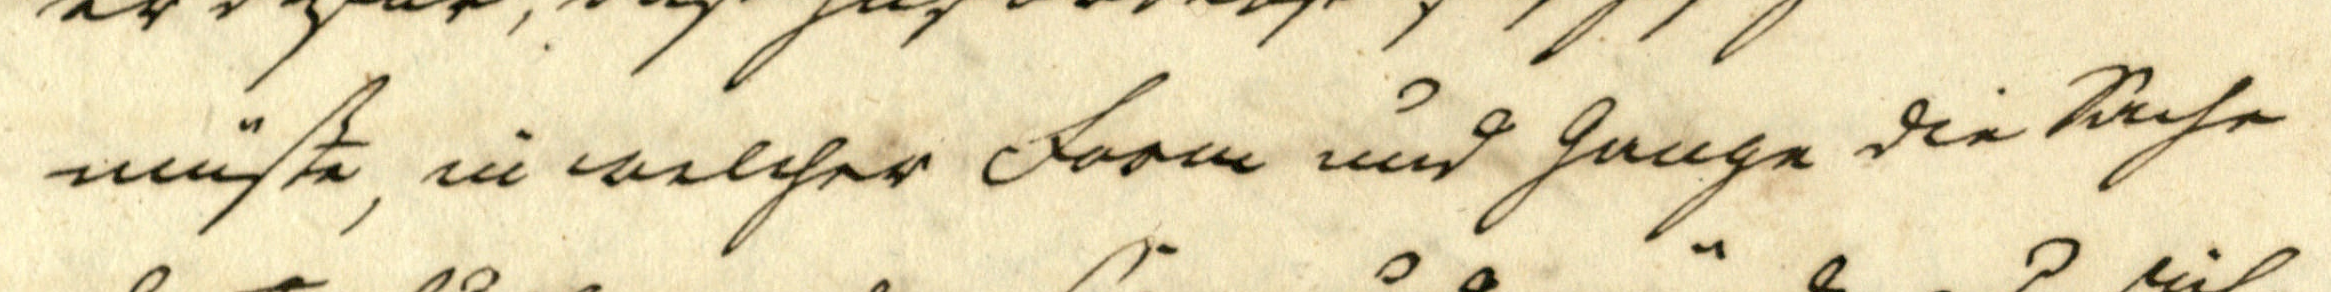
müßte in welcher Form und Gange die Sache
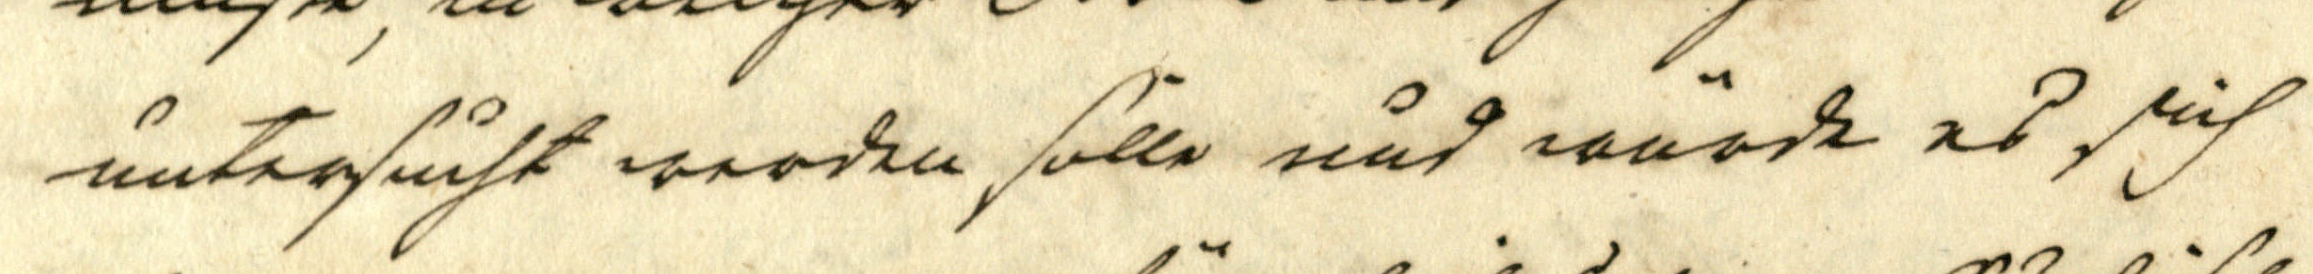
untersucht werden solle und würde es sich
